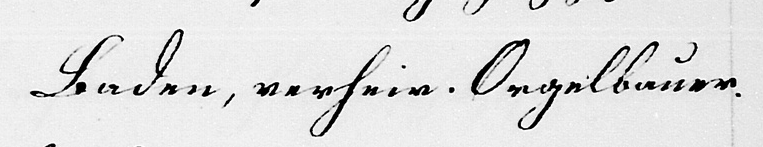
Baden, verheir. Orgelbauer.
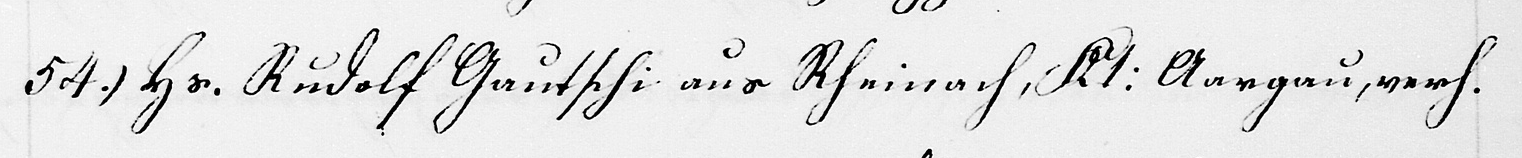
54.) Hs. Rudolf Gautschi aus Rheinach, Kt: Aargau, verh.
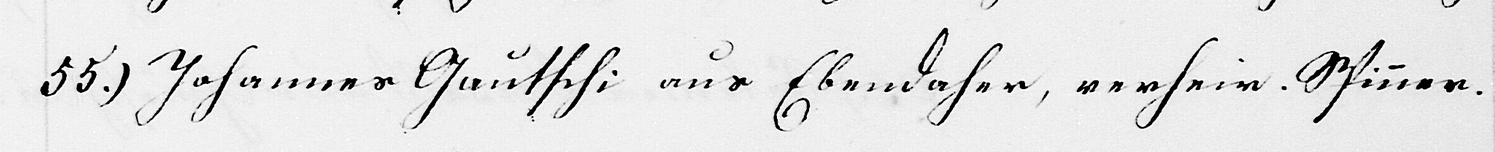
55.) Johannes Gautschi aus Ebendaher, verheir. Spinner.
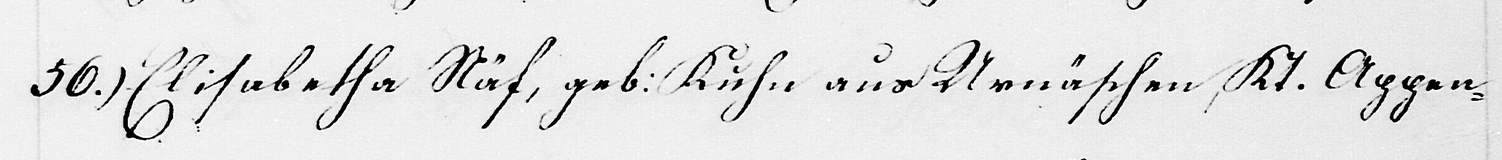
56.) Elisabetha Näf, geb: Kuhn aus Urnäschen, Kt. Appen¬
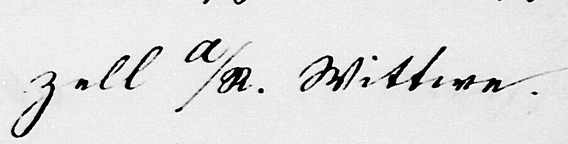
zell A/R. Wittwe.
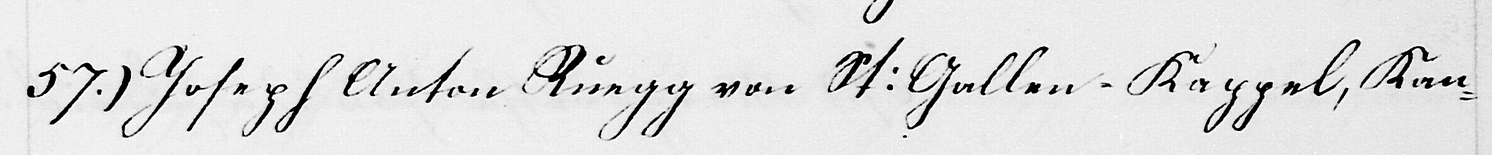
57.) Joseph Anton Ruegg von St: Gallen-Kappel, Kan¬
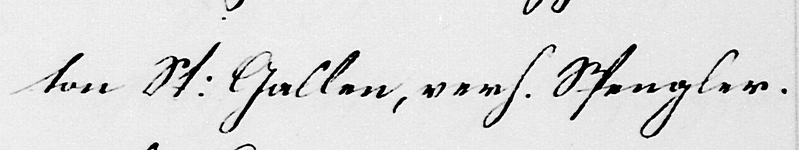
ton St: Gallen, verh. Spengler.
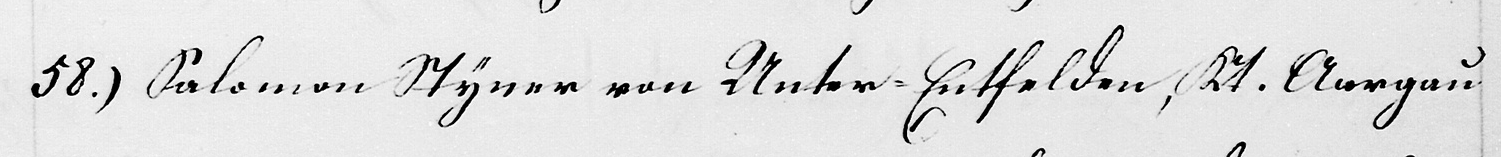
58.) Salomon Styner von Unter-Entfelden, Kt. Aargau
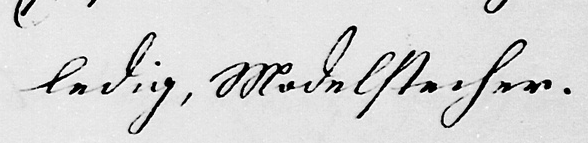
ledig, Modelstecher.
